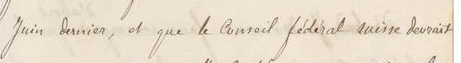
Juin dernier, et que le Conseil fédéral suisse devrait
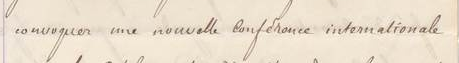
convoquer une nouvelle Conférence internationale
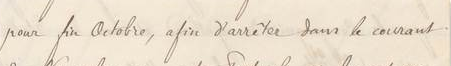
pour fin Octobre, afin d'arrêter dans le courant
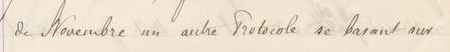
de Novembre un autre Protocole se basant sur
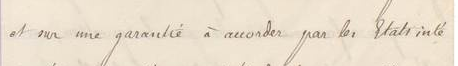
et sur une garantie à accorder par les Etats inté-
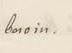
besoin.
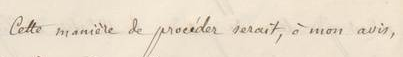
Cette manière de procéder serait, à mon avis,
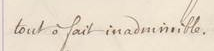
tout à fait inadmissible.
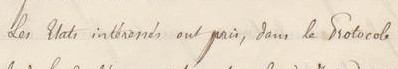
Les Etats intéressés ont pris, dans le Protocole
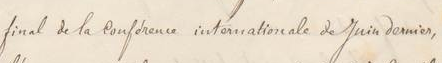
final de la Conférence internationale de Juin dernier,
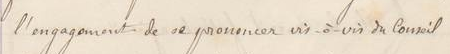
l'engagement de se prononcer vis-à-vis du Conseil
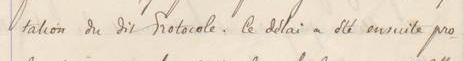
tation du dit Protocole. Ce délai a été ensuite pro-
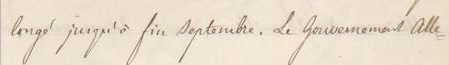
longé jusqu'à fin Septembre. Le Gouvernement Alle-
